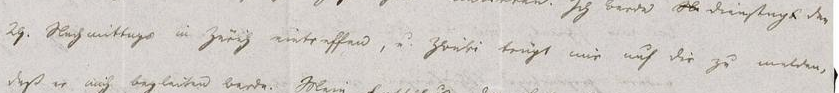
29. Nachmittags in Zürich eintreffen, u. Zwicki trägt mir auf Dir zu melden,
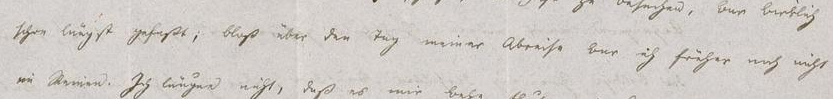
schon längst gefaßt; bloß über den Tag meiner Abreise war ich früher noch nicht
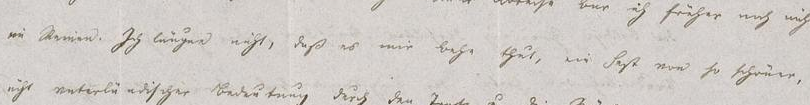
im Reinen. Ich läugne nicht, daß es mir wehe thut, ein Fest von so schöner,
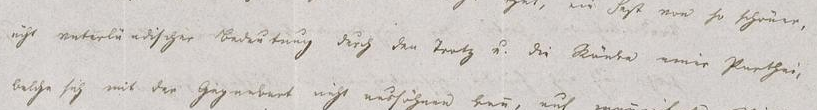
ächt vaterländischer Bedeutung durch den Trotz u. die Ränke einer Parthei,
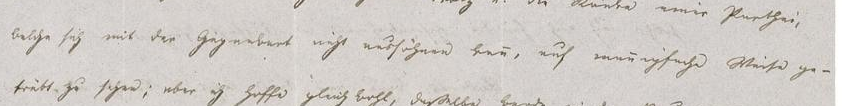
welche sich mit der Gegenwart nicht aussöhnen kann, auf mannigfache Weise ge-
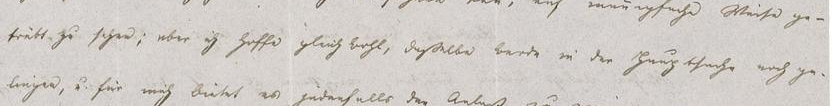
trübt zu sehen, aber ich hoffe gleich wohl, dasselbe werde in der Hauptsache noch ge-
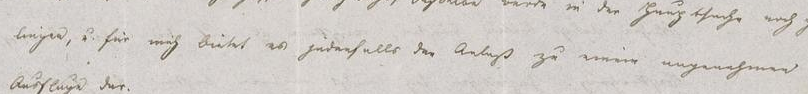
lingen,u. für mich bietet es jedenfalls den Anlaß zu einem angenehmen
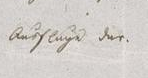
Ausfluge dar.
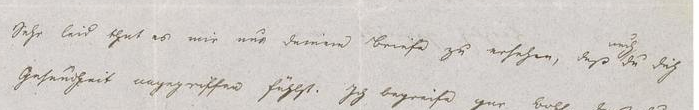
Sehr leid thut es mir aus Deinem Briefe zu erfahren, daß auch
